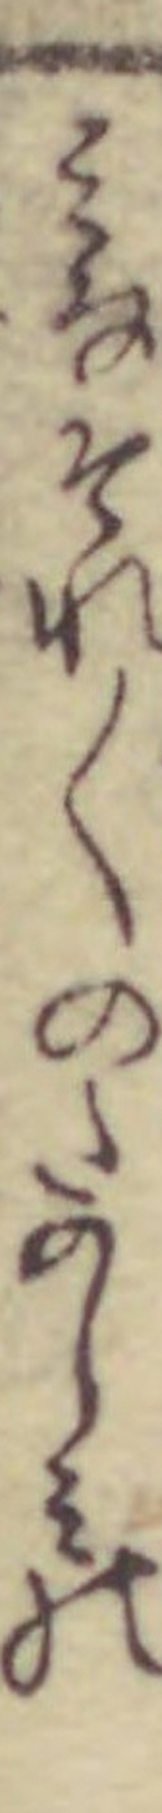みなそれ〳〵のたのしみの
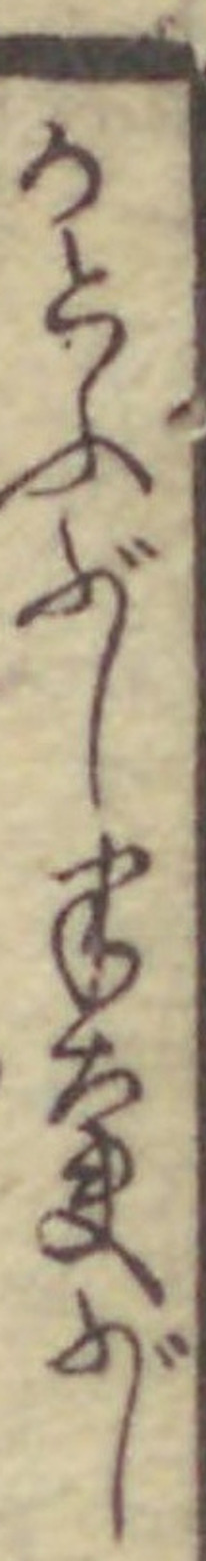かとふぶし半太夫ぶし
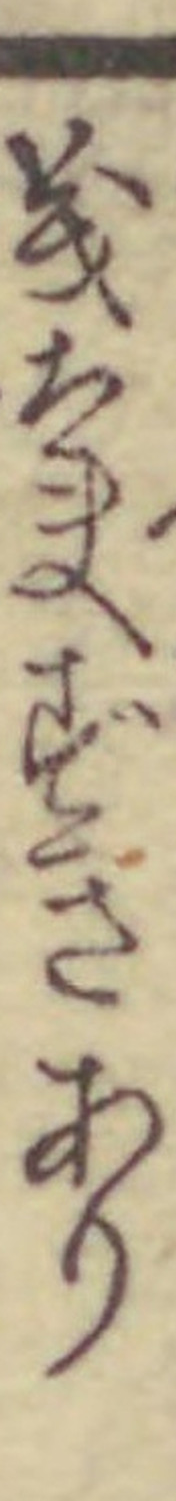義太夫ずきあり
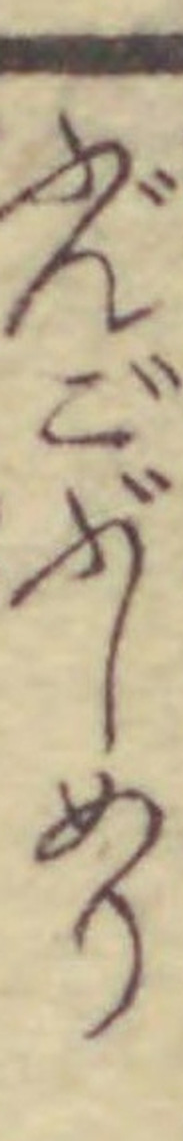ぶんごぶしめり
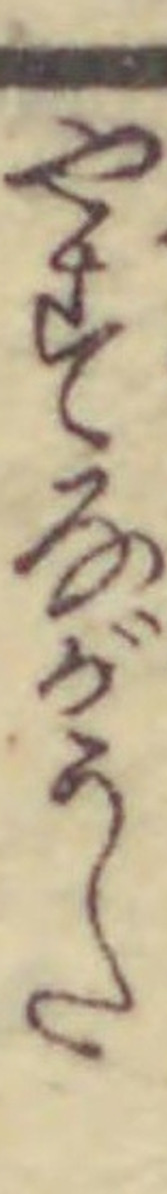やすながうた
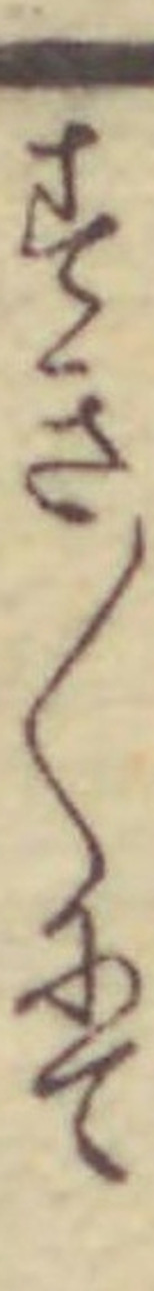すき〳〵にて
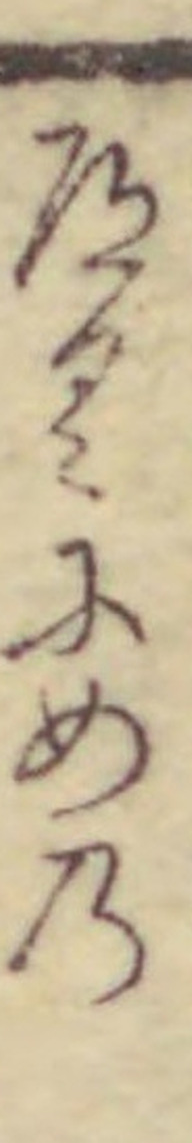道具にめの
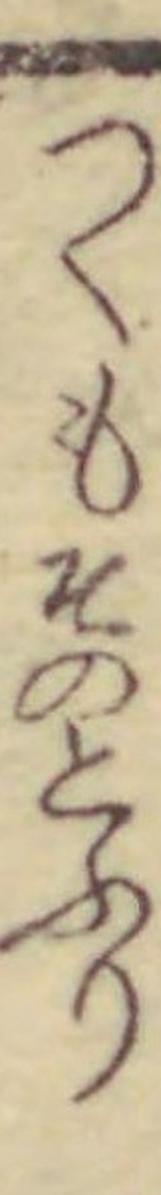つくもそのとふり
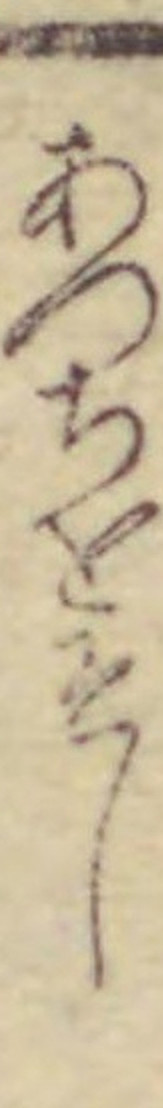あつちをそし
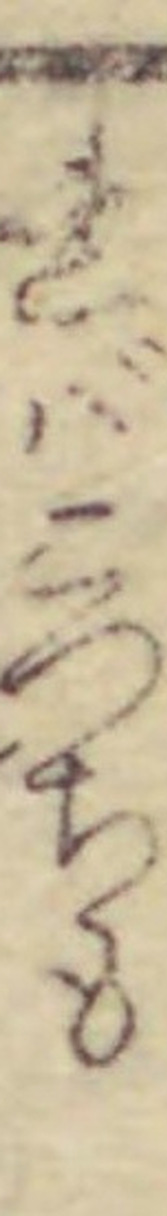ればこつちも
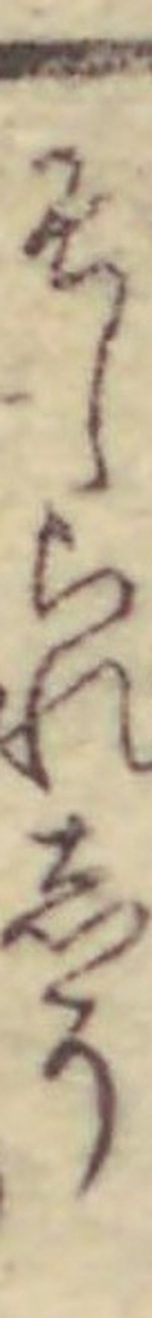そしられしう
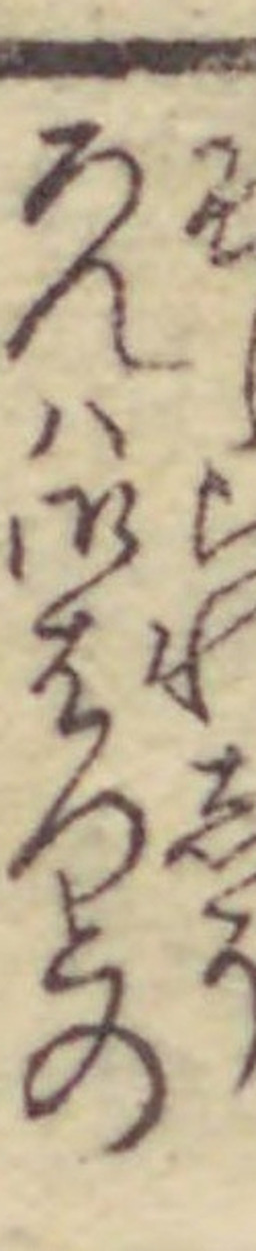ろんは御はつとの
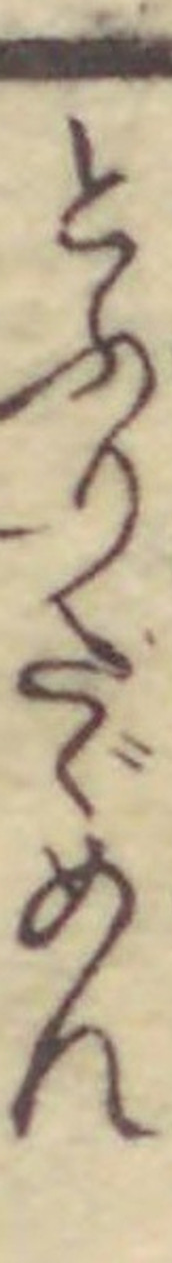とふりたゞめん
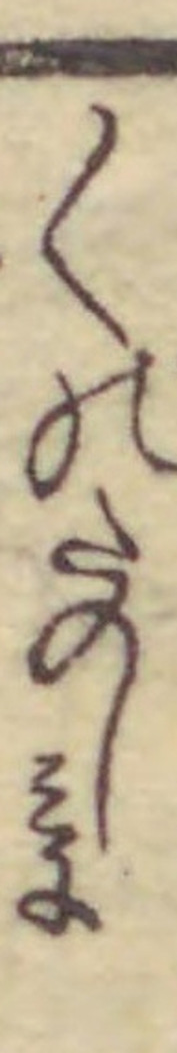〳〵のたのしみに
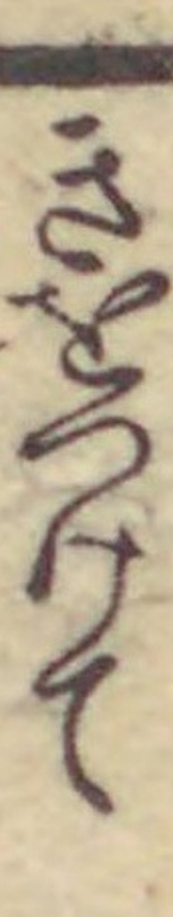きをつけて
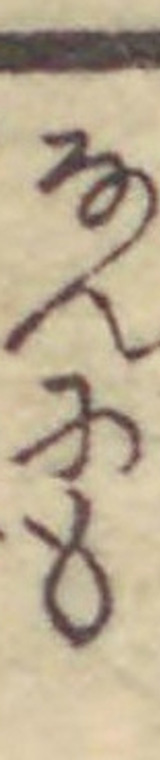なんにも
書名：大通人穴[サガシ] 3巻
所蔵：国立国会図書館 National Diet Library, JAPAN
